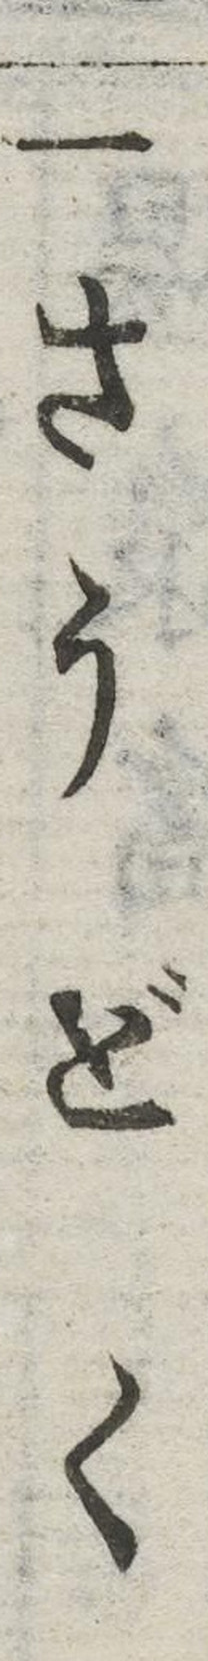一さうどく
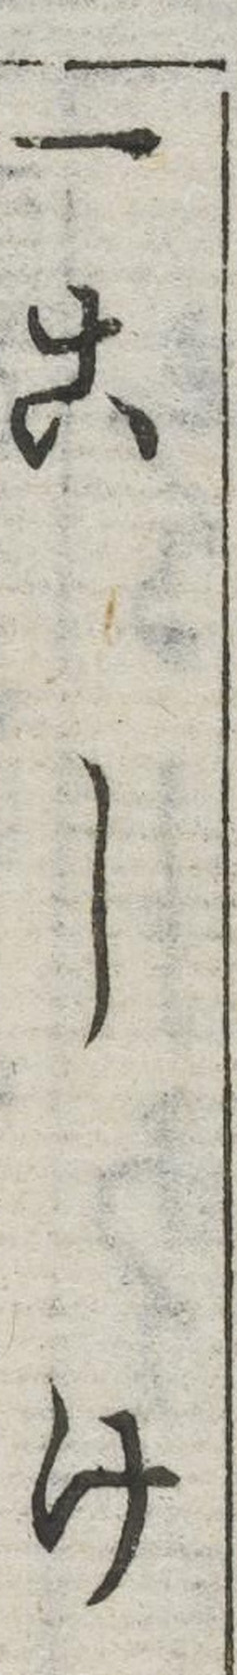一こしけ
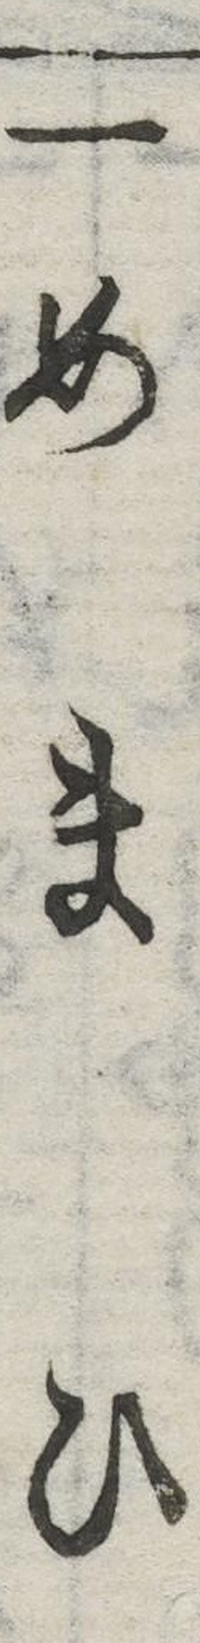一めまひ
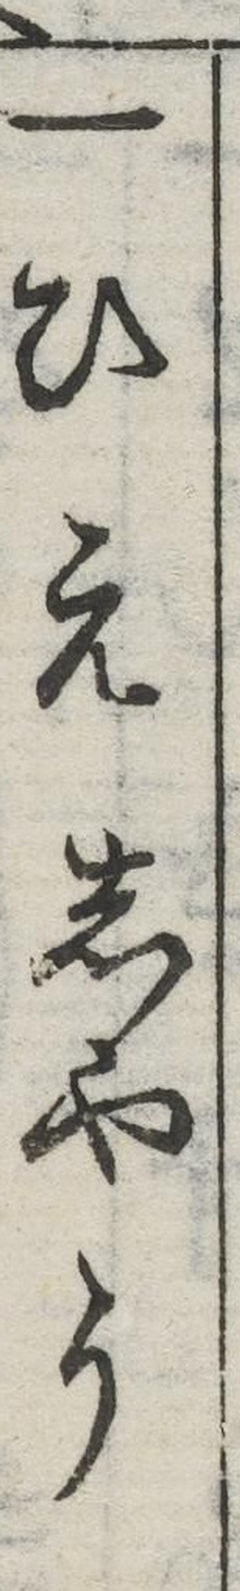一ひえしやう
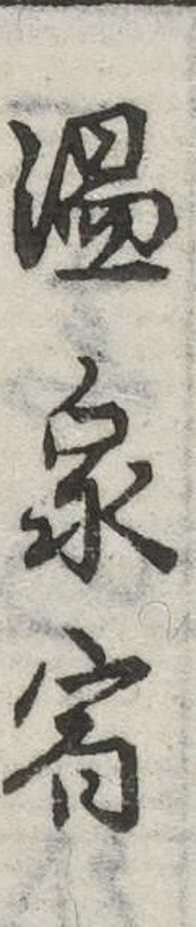温泉宿
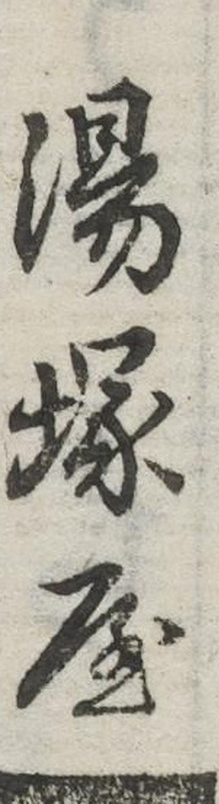湯塚屋

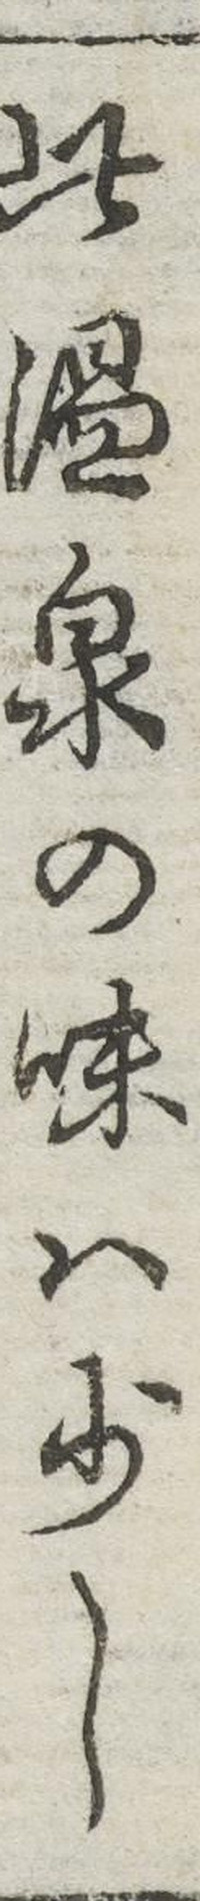此温泉の味は少し
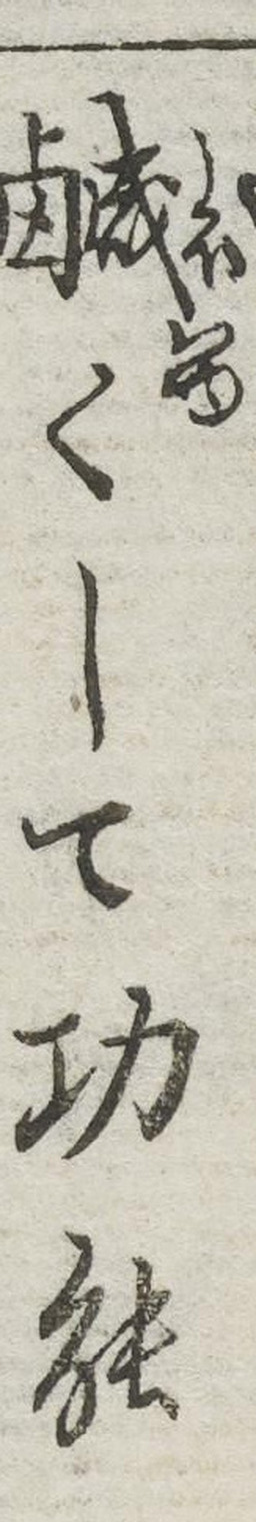鹹くして功能
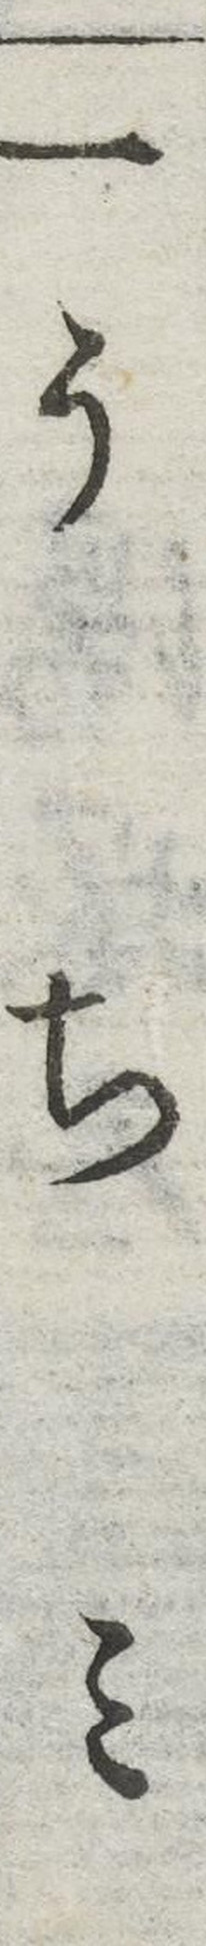一うちみ
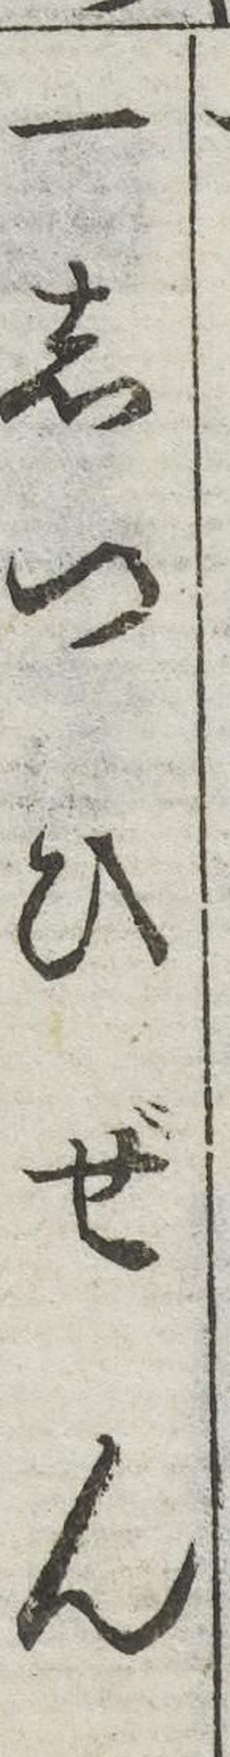一しつひぜん
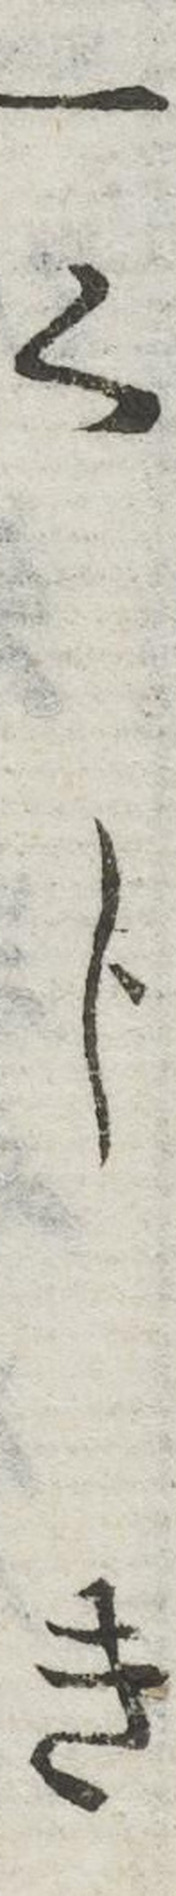一くじき
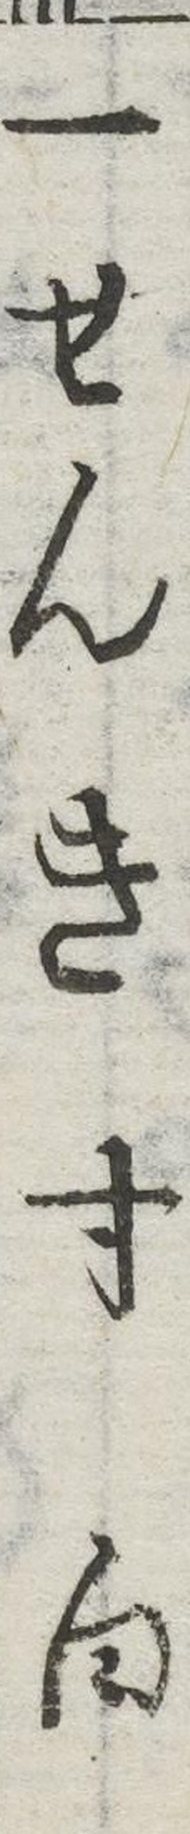一せんき寸白
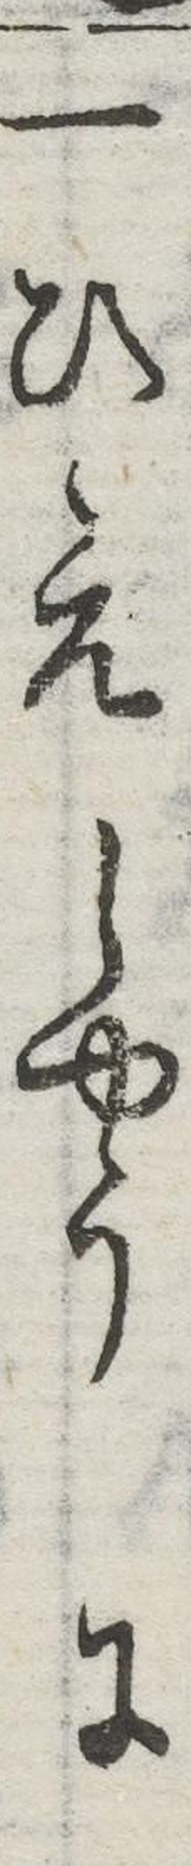一ひえしやうに
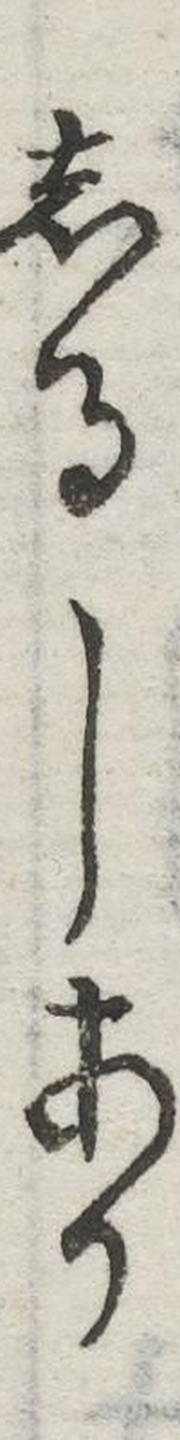しるしあり
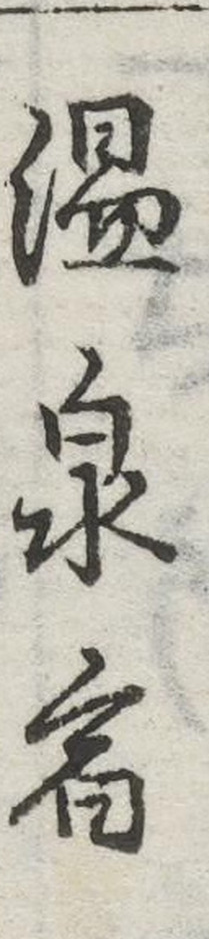温泉宿
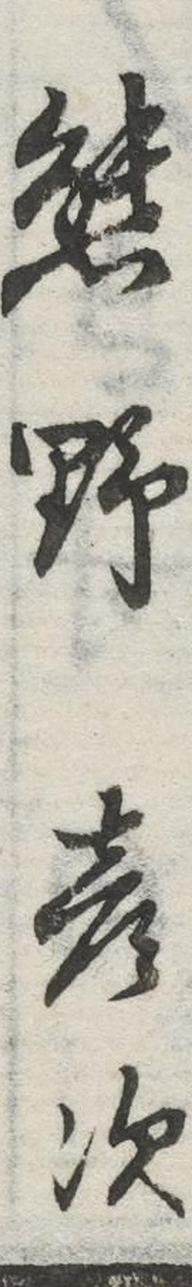熊野彦次
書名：諸國温泉遊覽記　全
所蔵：東京大学地震研究所図書室 Earthquake Research Institute Library, The University of Tokyo, JAPAN
